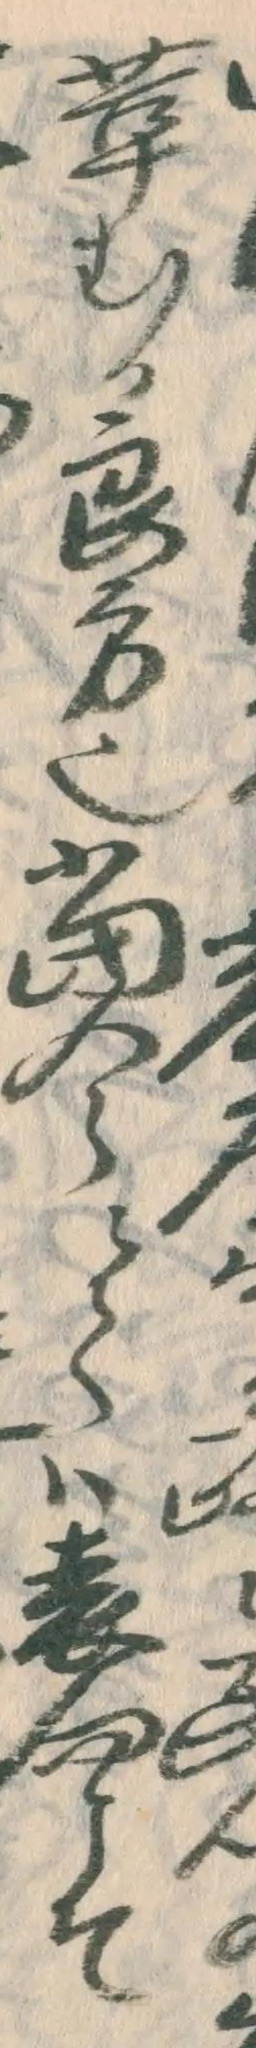革むる良方也當今ニてハ表向には
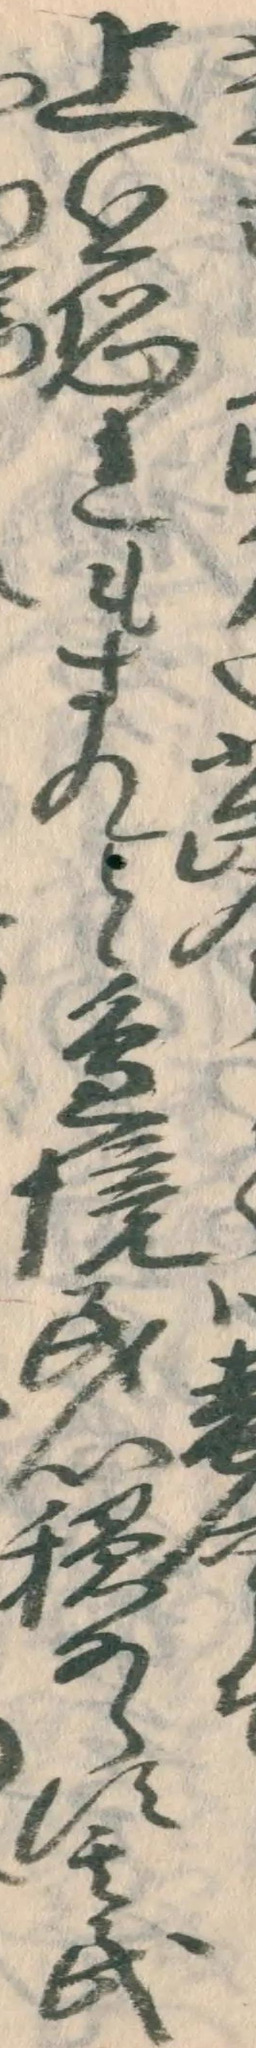上を恐れもすれは邊境民心穏ならす其民
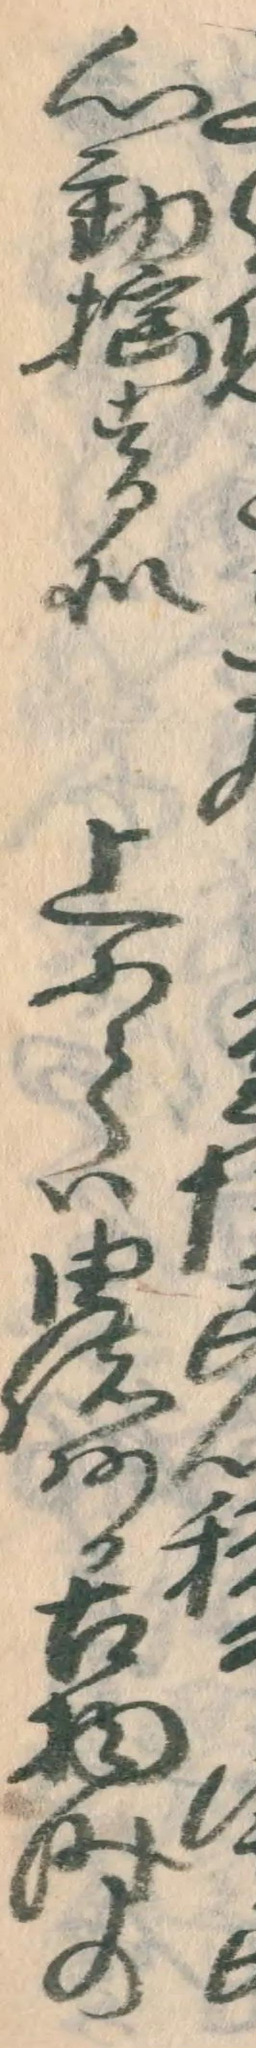心動揺する処上にてハ由緒ある古物時の

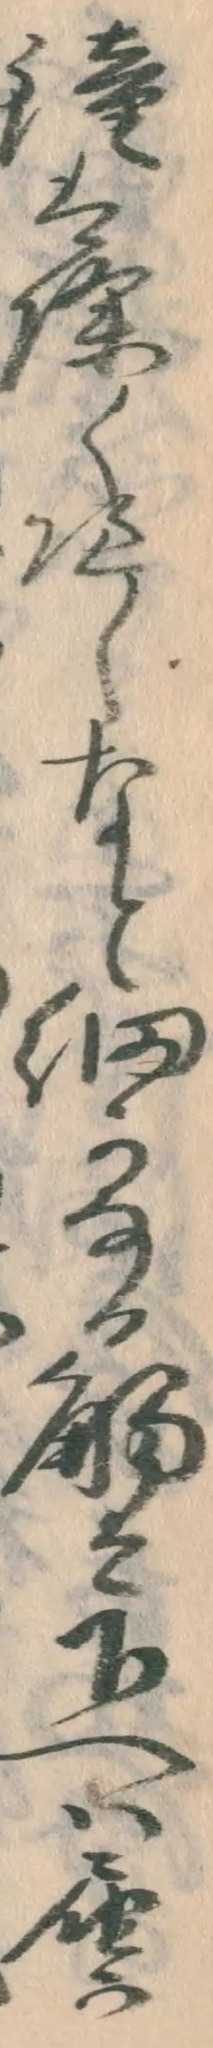鐘は除くへしなと細かなる触は下へハ届か
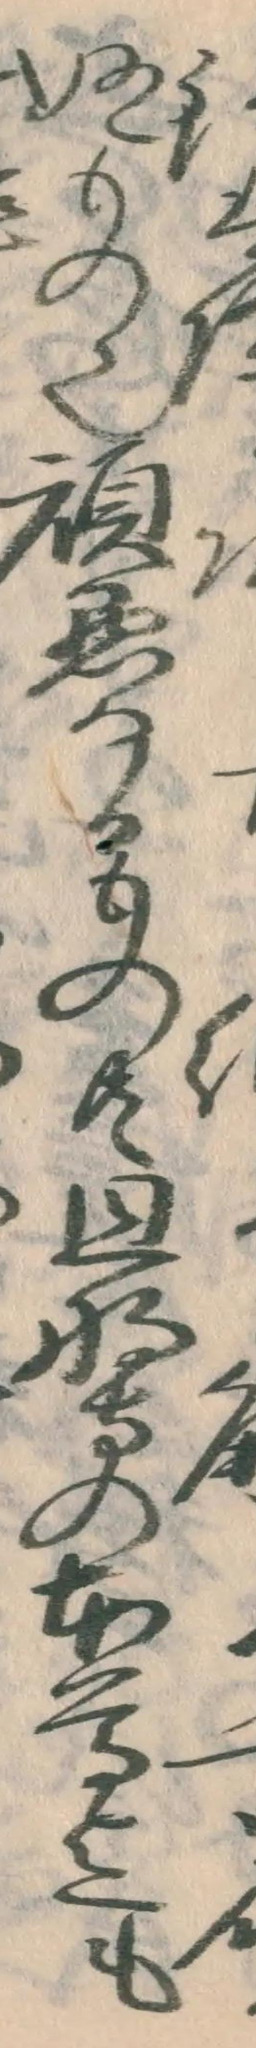ぬもの也頑愚なるもの共旦那寺の本尊迄も
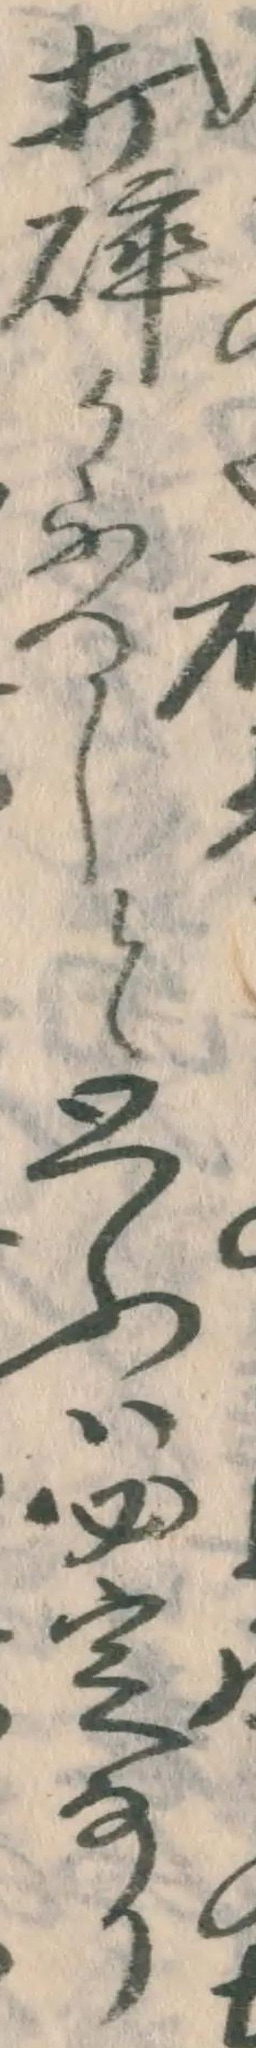打碎かるへしと思うふハ必定なり
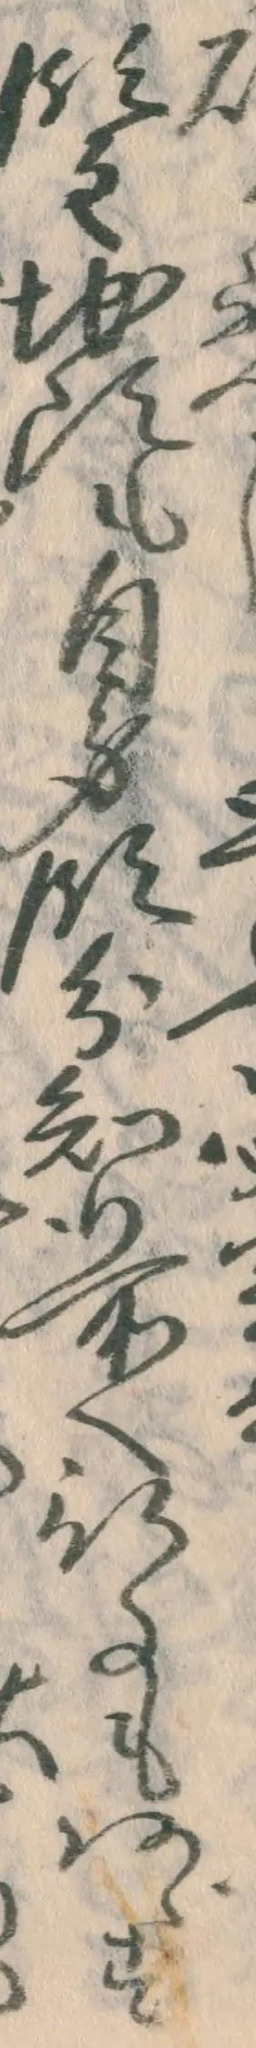領主地頭も自身領分知行所へ行事もあらす
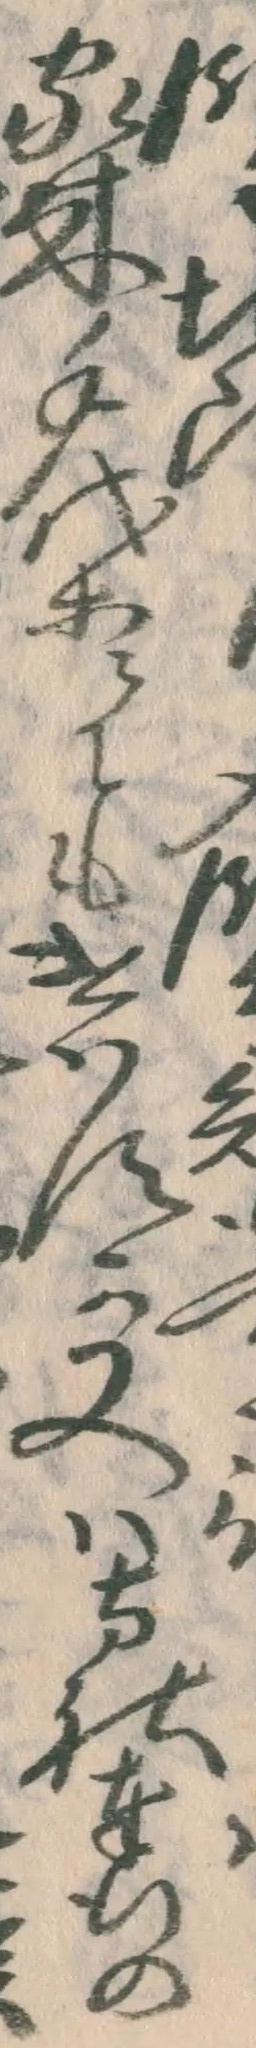家来手代等ニても遣ハすか又ハ寺社奉行の
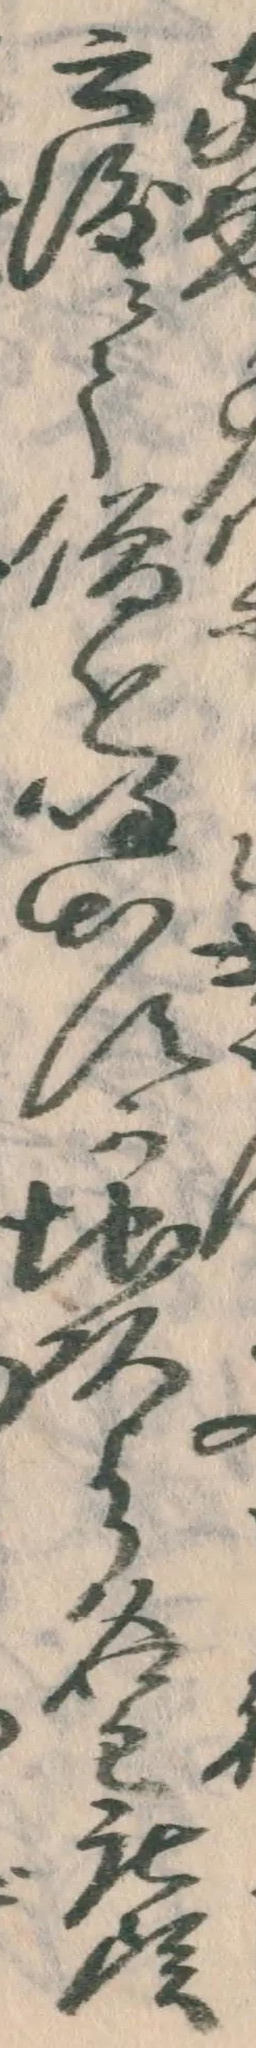云渡ニて僧を呼出すか地頭より名主庄屋
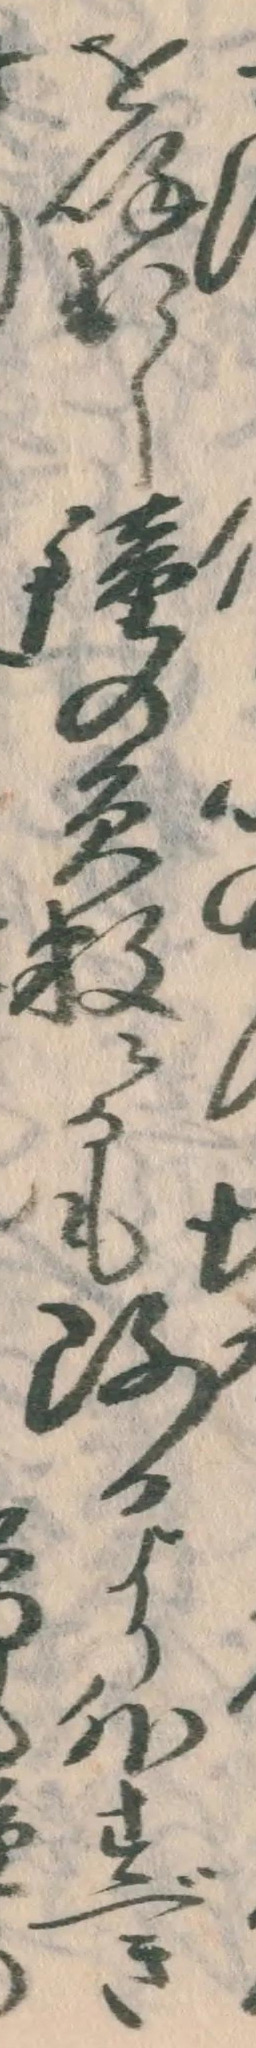を呼出し鐘の員数ニ而も改るより外すべき
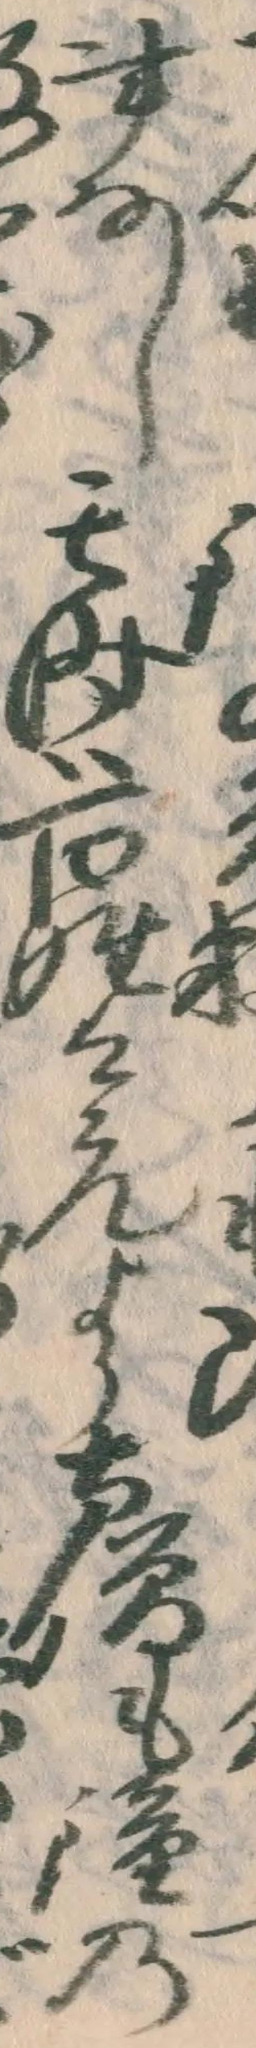事なし其時ハ百姓は元より寺僧も鐘の
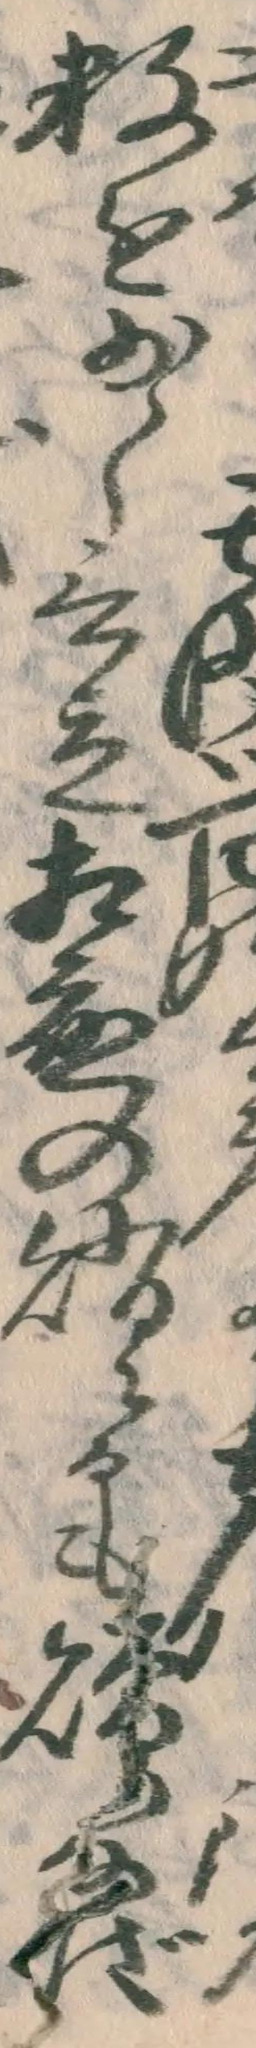数を少く云立相應の賄ニ而も贈りなば
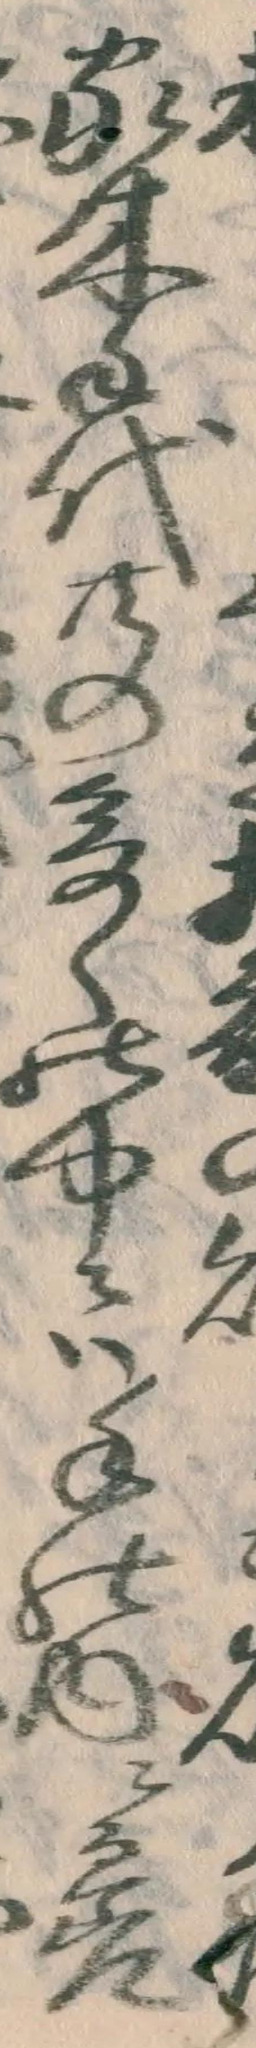家来手代共の多くの中ニハ手の内ニ而差
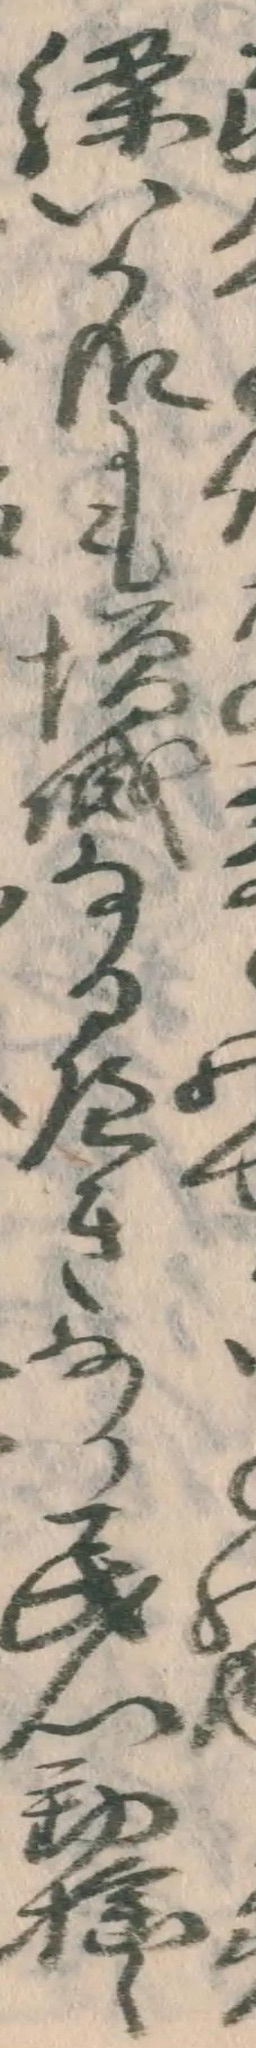繰いか様にも増減なるへきなり民心動揺し
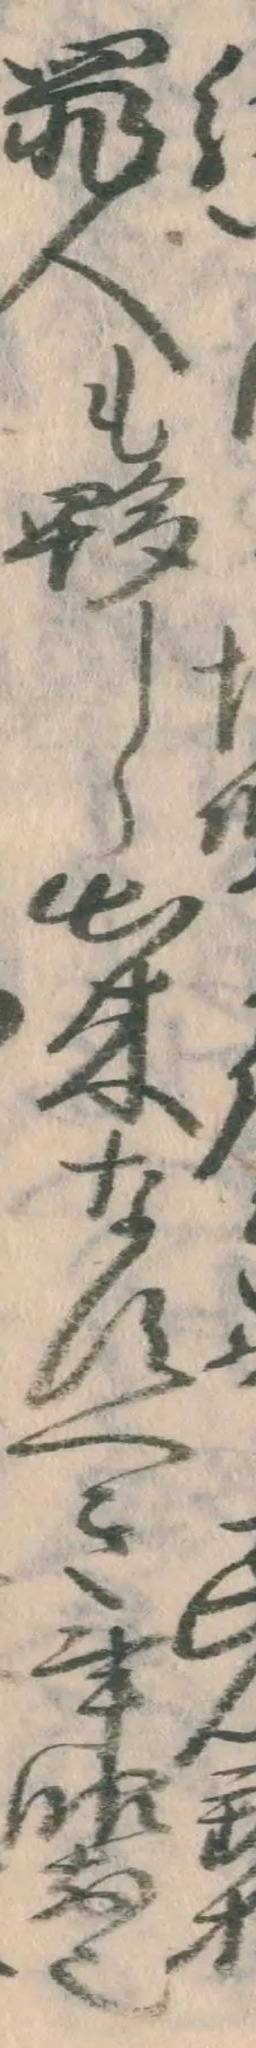罪人も夥しく出来なすへき事眼前也
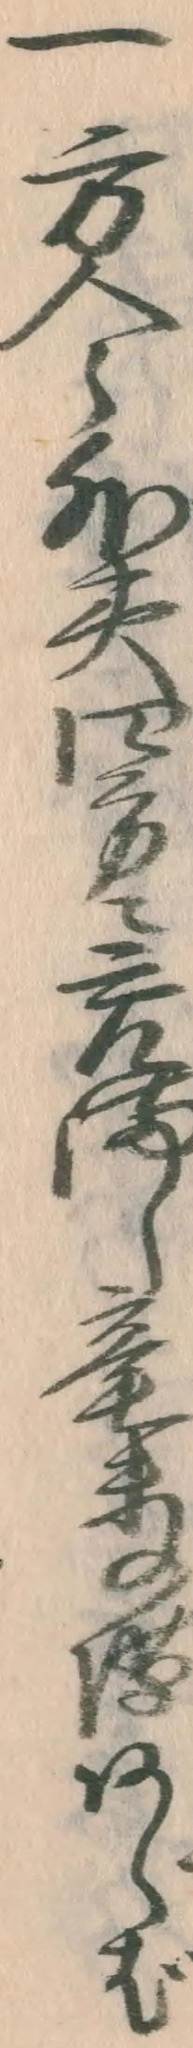一方人之外夷四方ニ充満し毫末の隙あらば
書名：麗斎叢書. 20
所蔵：国立国会図書館 National Diet Library, JAPAN
